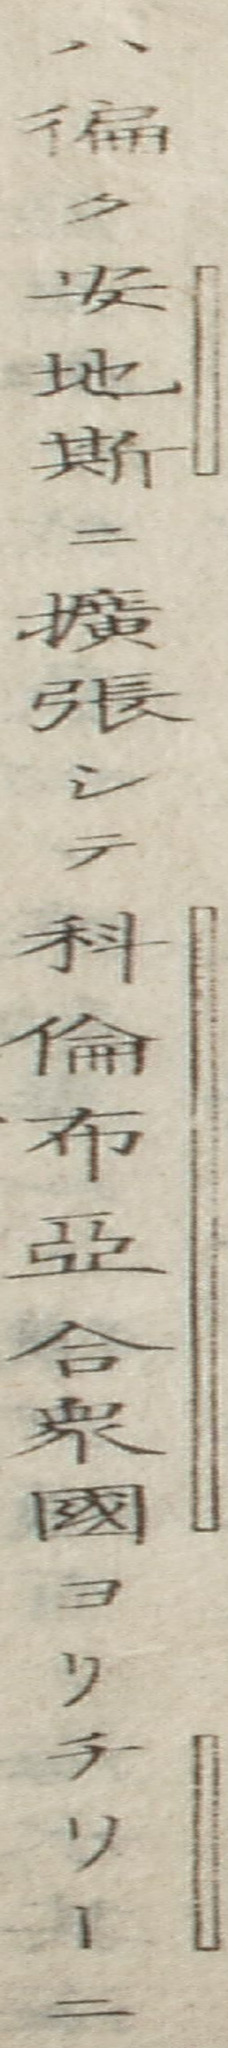ハ徧ク安地斯ニ拡張シテ科倫布亜合衆国ヨリチリーニ
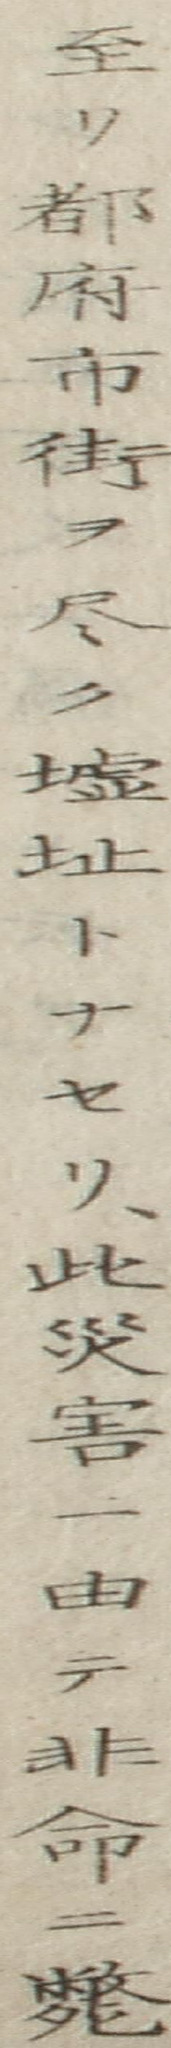至リ都府市街ヲ尽ク墟址トナセリ、此災害一由テ非命ニ斃

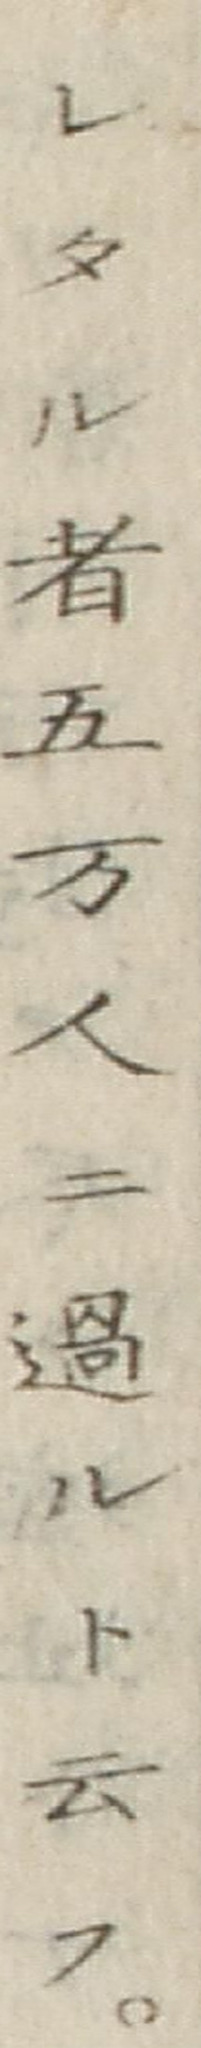レタル者五万人ニ過ルト云フ。
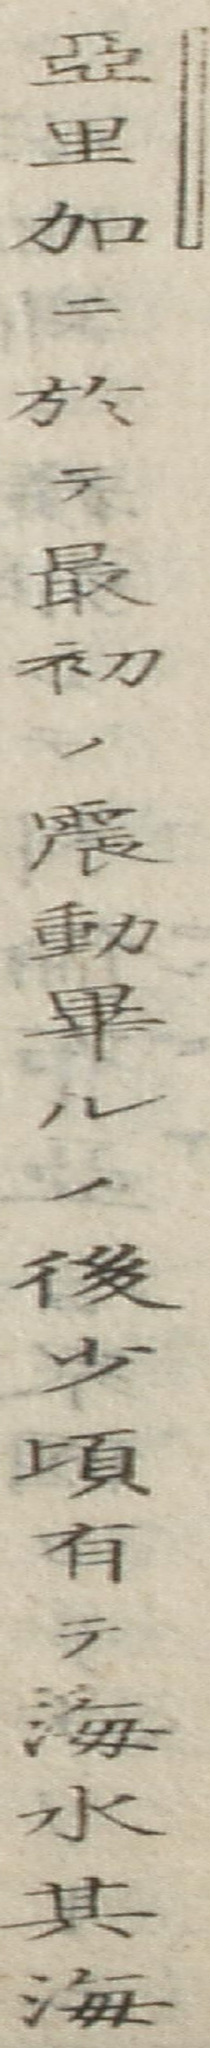亜利加ニ於テ最初ノ震動畢ルノ後少頃有テ海水其海
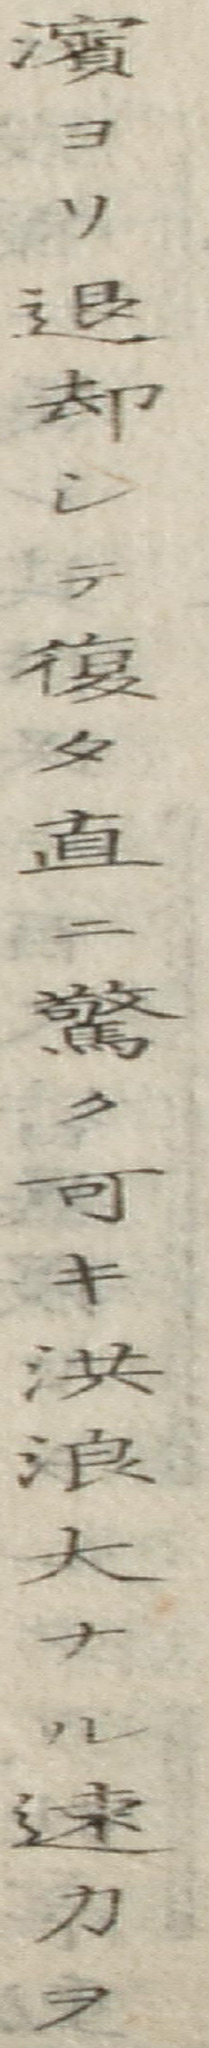浜ヨリ退却シテ復タ直ニ驚ク可キ洪浪大ナル速力ヲ
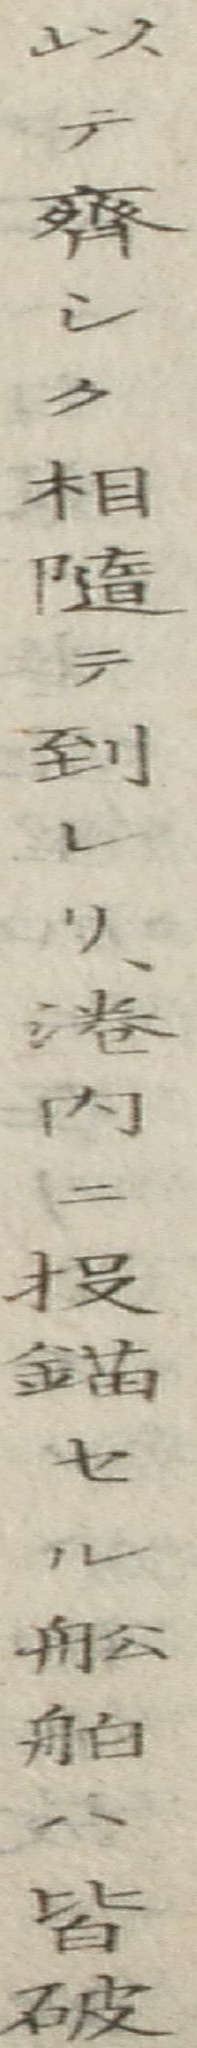以テ齊シク相隨テ到レリ、港内ニ投錨セル船舶ハ皆破
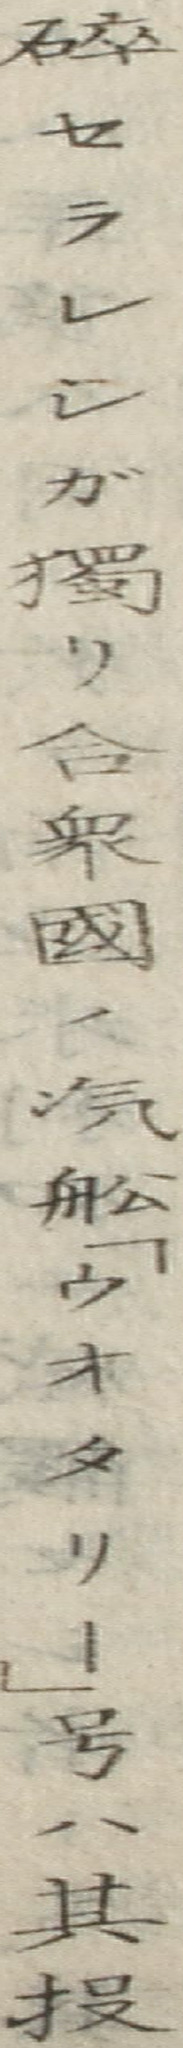砕セラレシガ獨リ合衆国ノ汽船「ウオタリー」号ハ其投
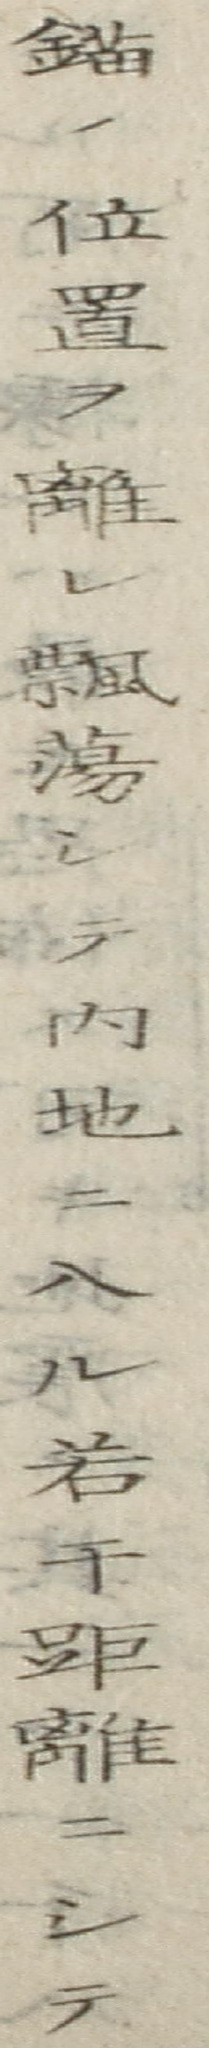錨ノ位置ヲ離レ飄蕩シテ内地ニ入ル若干距離ニシテ
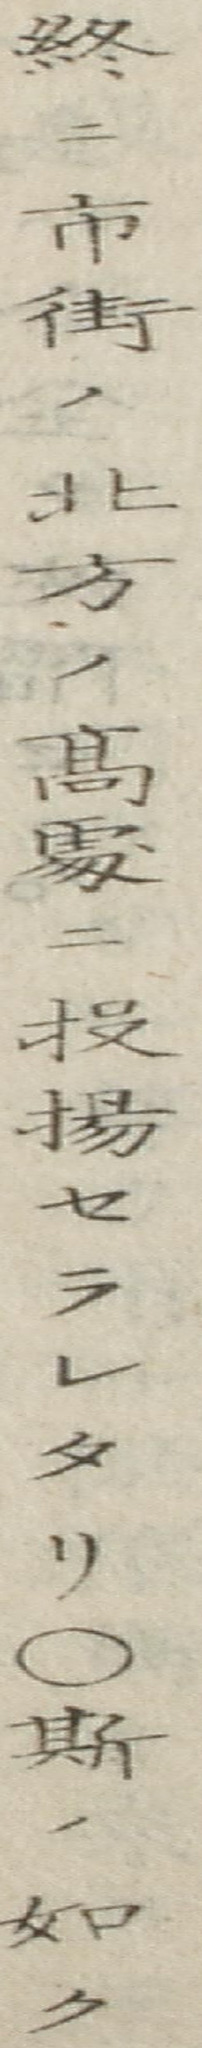終ニ市街ノ北方ノ高處ニ投揚セラレタリ〇斯ノ如ク
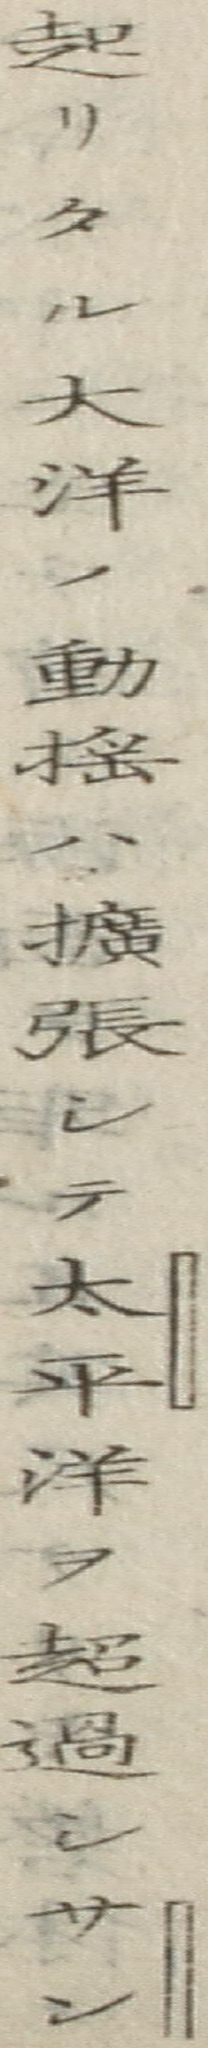起リタル大洋ノ動揺ハ拡張シテ太平洋ヲ超過シサン
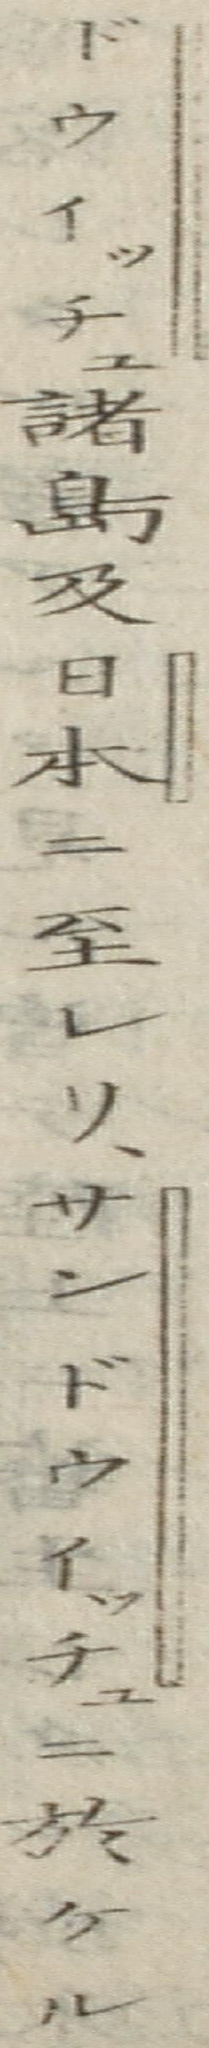ドウイッチュ諸島及日本ニ至レリ、サンドウイッチュニ於ケル
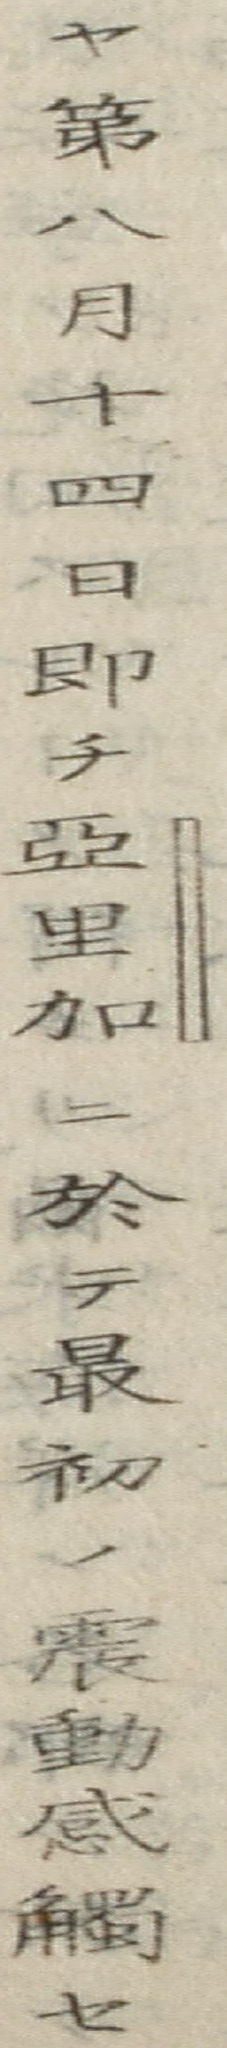ヤ第八月十四日即チ亜里加ニ於テ最初ノ震動感触セ
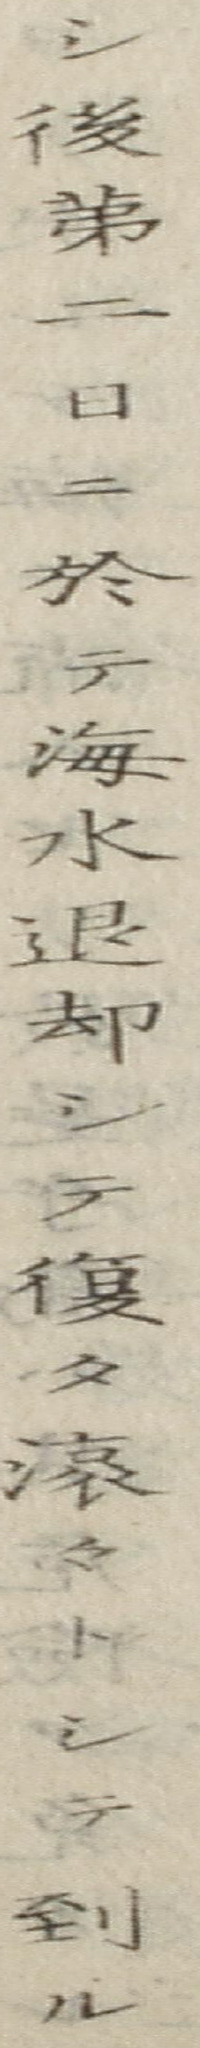シ後第二日ニ於テ海水退却シテ復タ滾々トシテ到ル
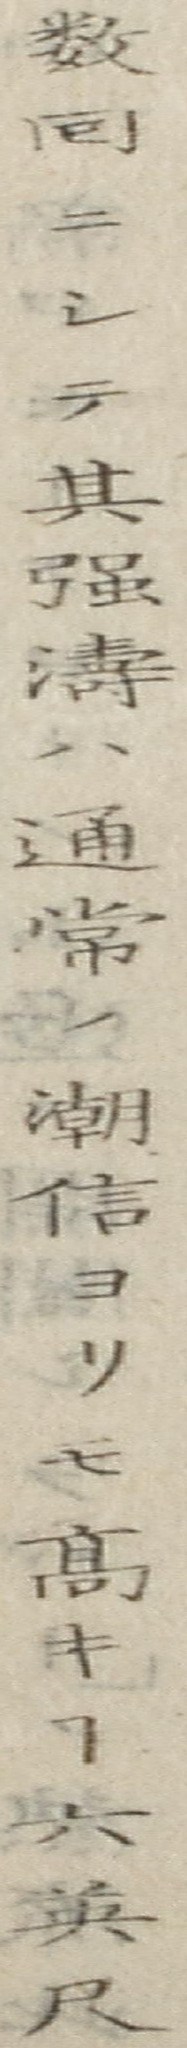数回ニシテ其強濤ハ通常ノ潮信ヨリモ高キヿ六英尺
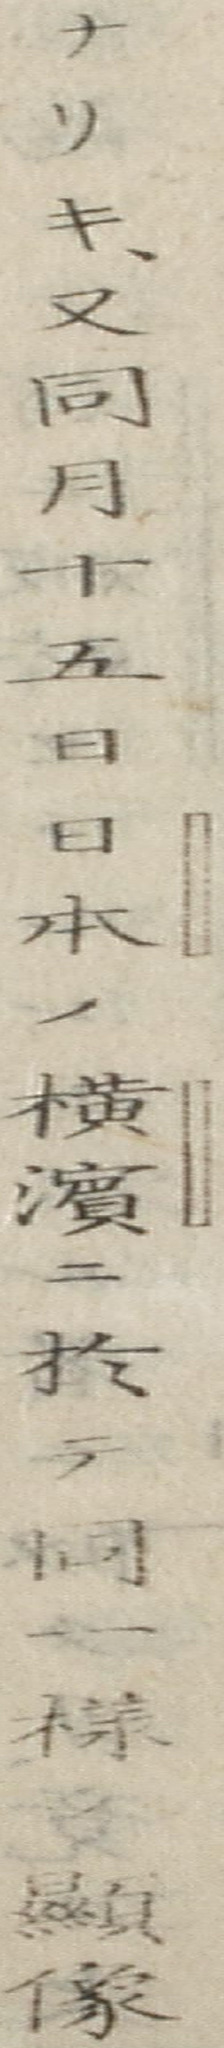ナリキ、又同月十五日日本ノ横浜ニ於テ同一様ノ顕像
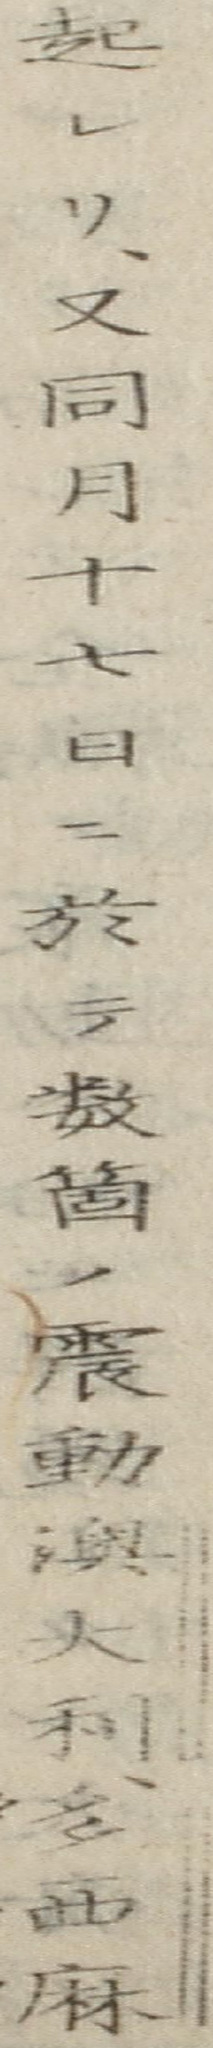起レリ、又同月十七日ニ於テ数箇ノ震動墺太利、多西麻
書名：地形論　巻二
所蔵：東京大学地震研究所図書室 Earthquake Research Institute Library, The University of Tokyo, JAPAN
